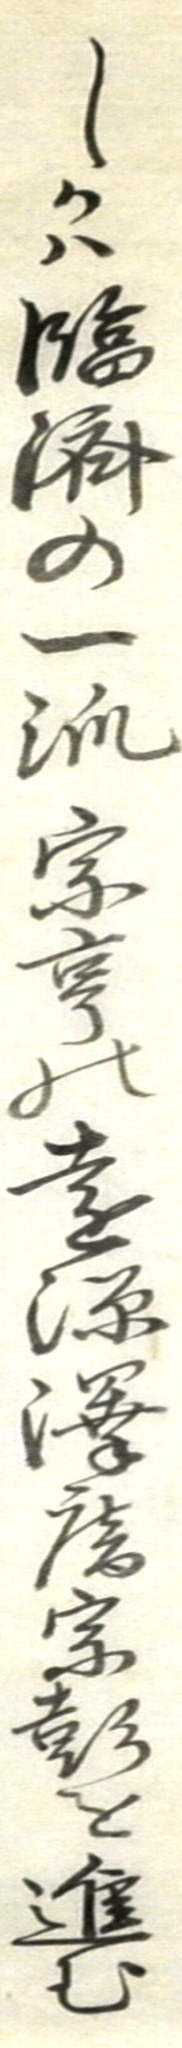しかは臨済の一派宗享の遠源沢庵宗彭を進む
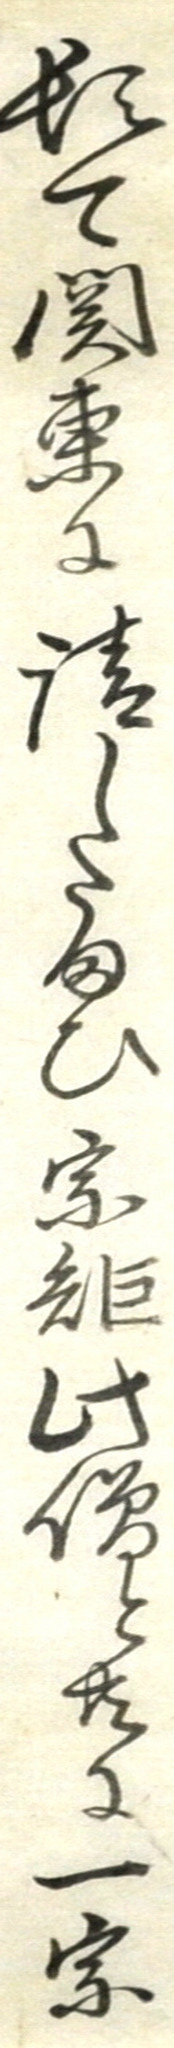頓て関東に請したまひ宗矩此僧と共に一宗
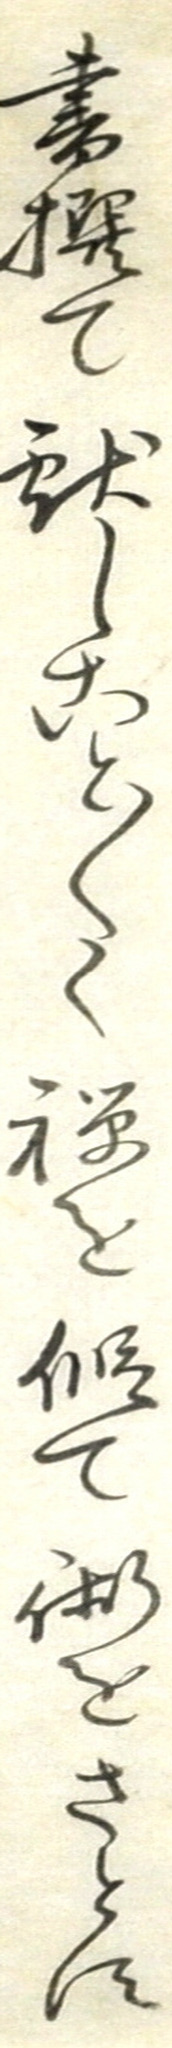書撰て献しこと〳〵く禅を仮て術をさとす
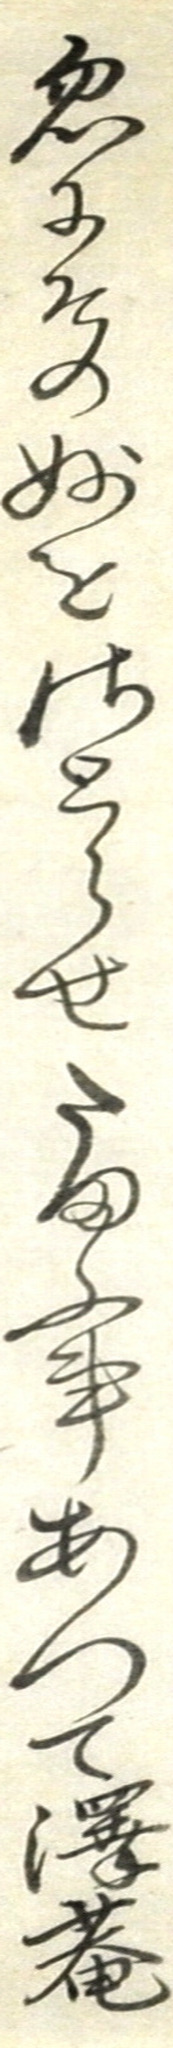忽にその妙をさとらせたまふ事あつて沢庵
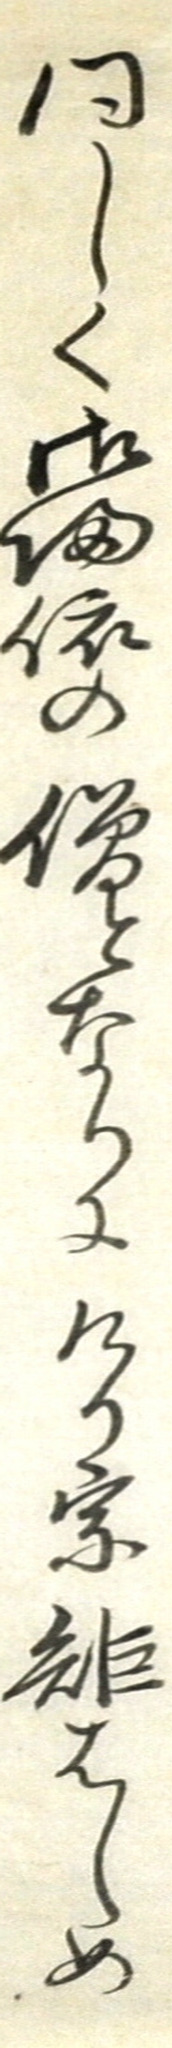同しく御帰依の僧となりにけり宗矩はしめ
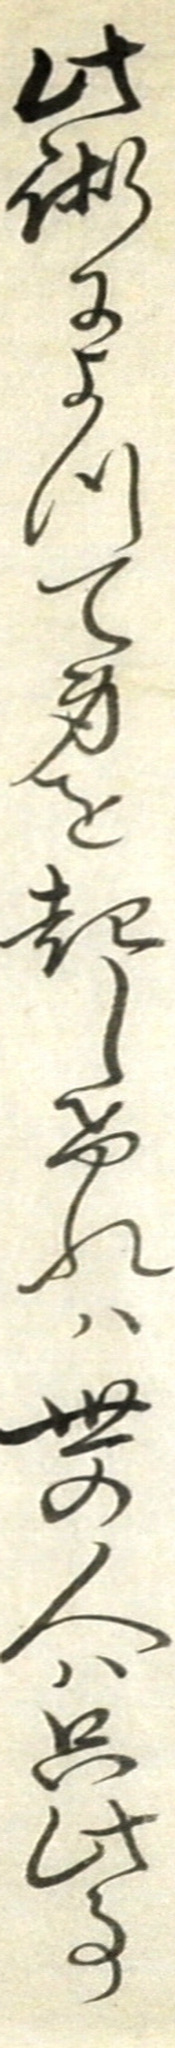此術によつて身を起しけれは世のひとは只此事
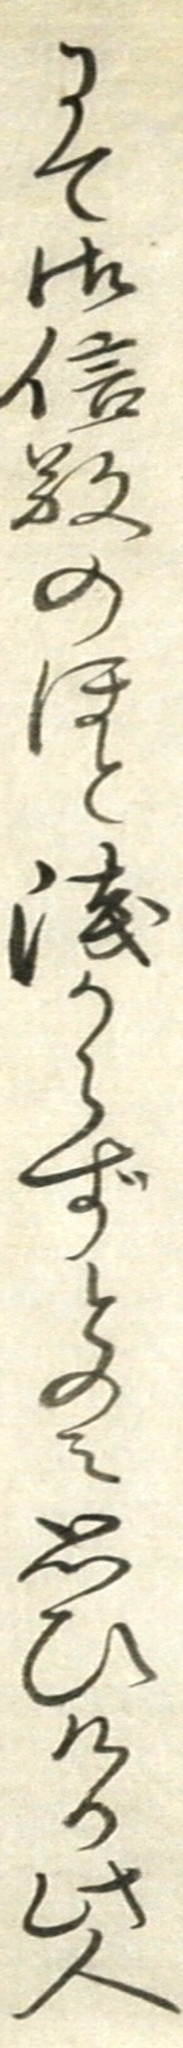にて御信敬のほと浅からずとのみ思ひけり此人
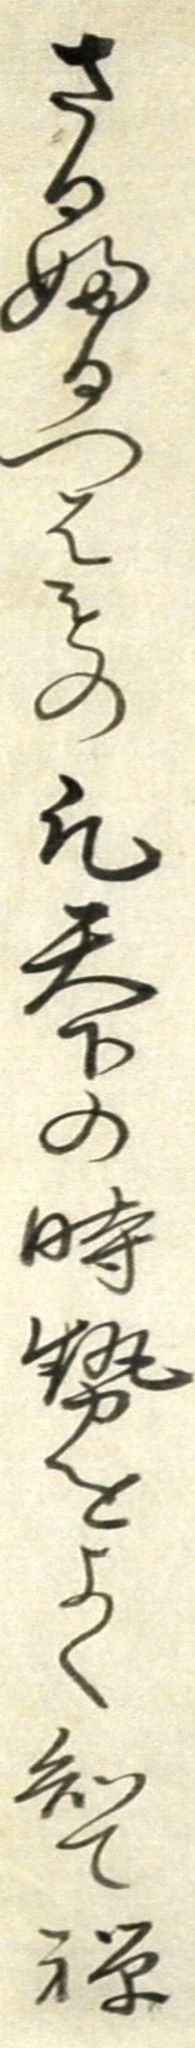さるふるつはもの凡天下の時勢をよく知て禅
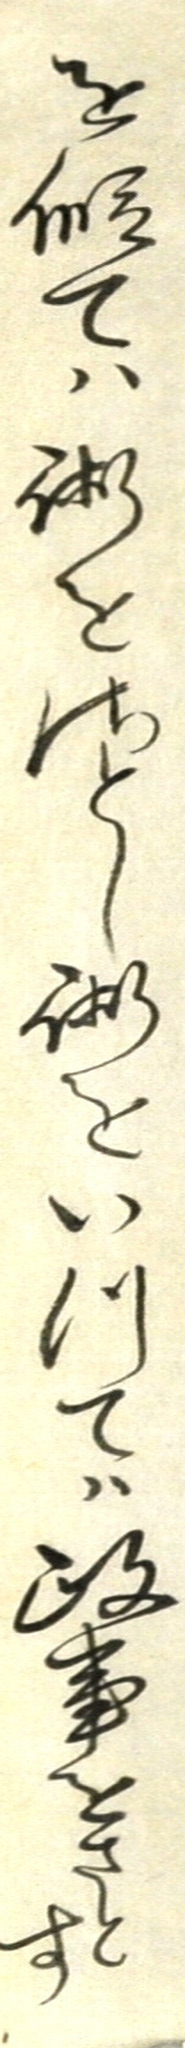を仮ては術をさとし術をいつては政事をさとす

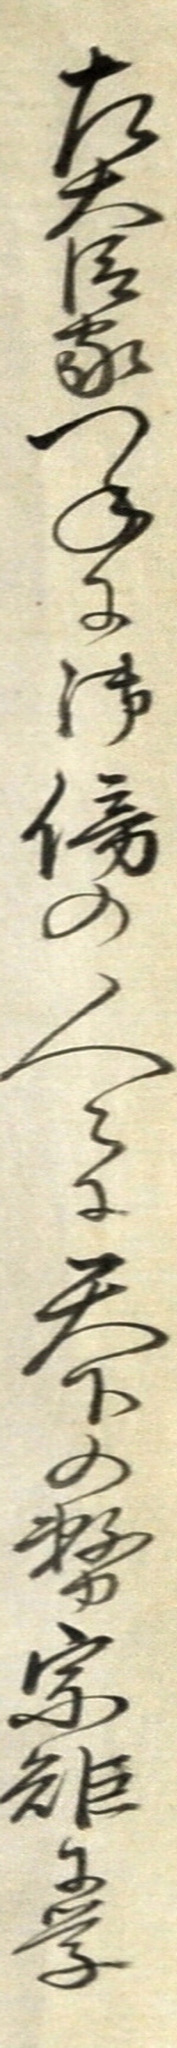左大臣家つねに御傍の人々に天下の務宗矩に学
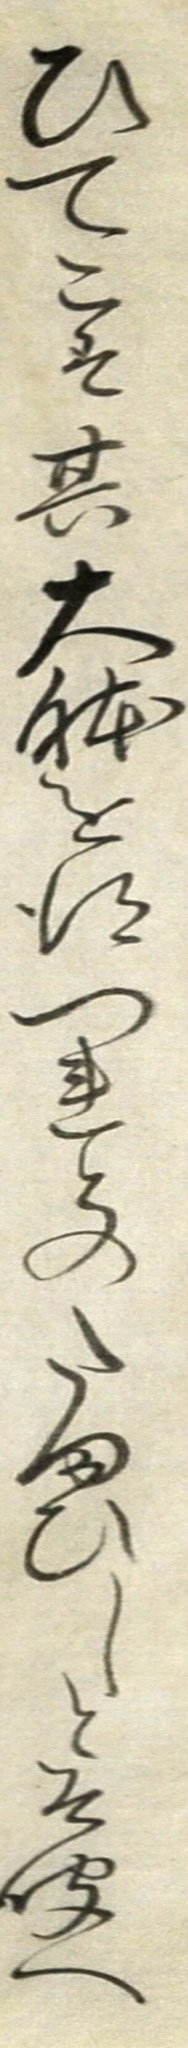ひてこそ其大体を得つれとのたまひしとそ聞へ
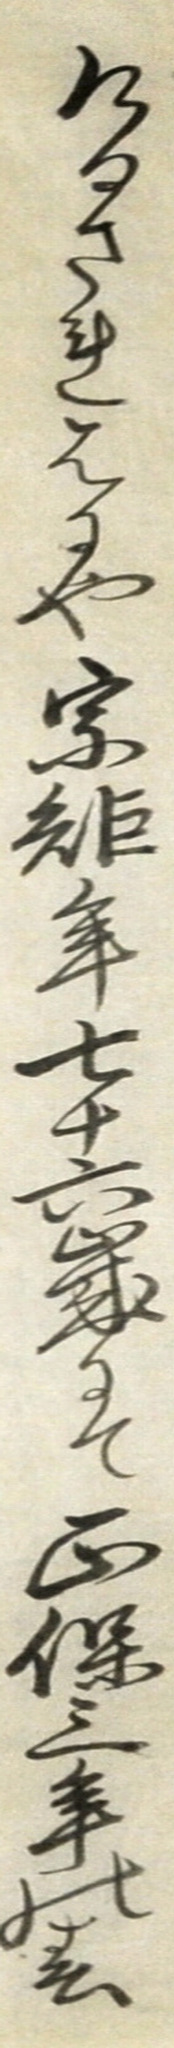けるされはにや宗矩年七十六歳にて正保三年の春
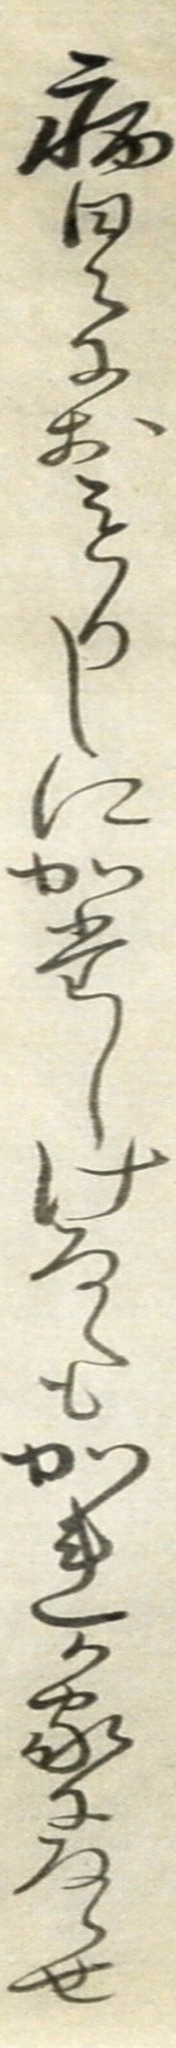病日々におもりしにかたしけなくもかれか家にならせ
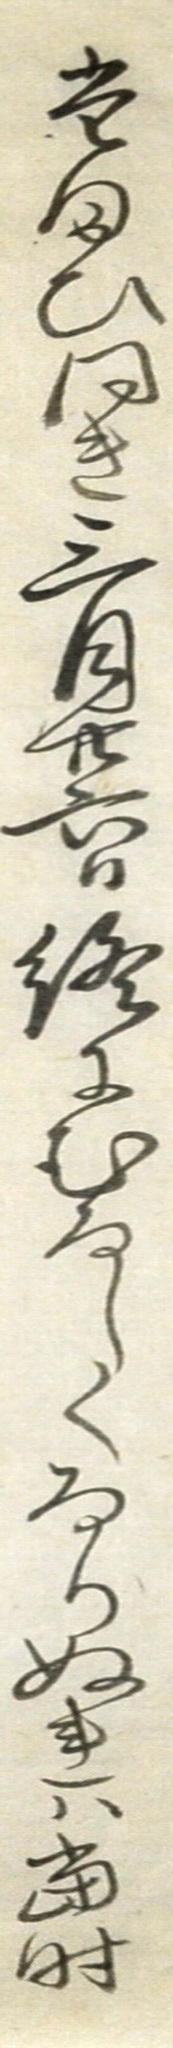たまひ同き三月廿六日終にむなしくなりぬれは当時
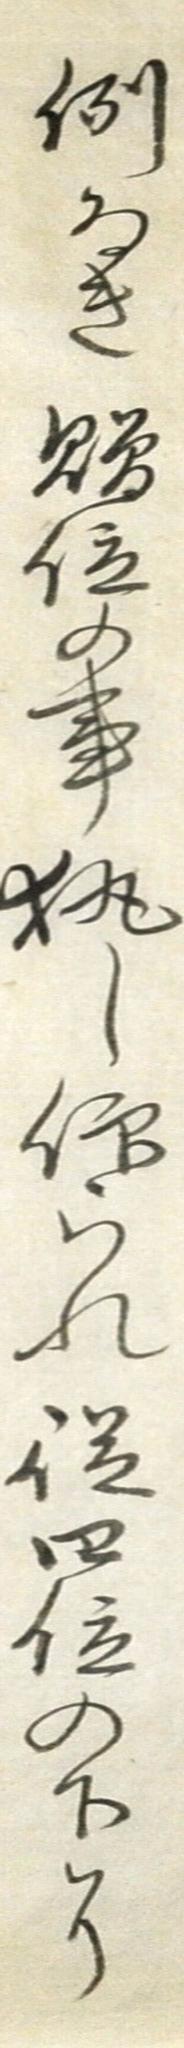例なき贈位の事執し仰られ従四位の下に
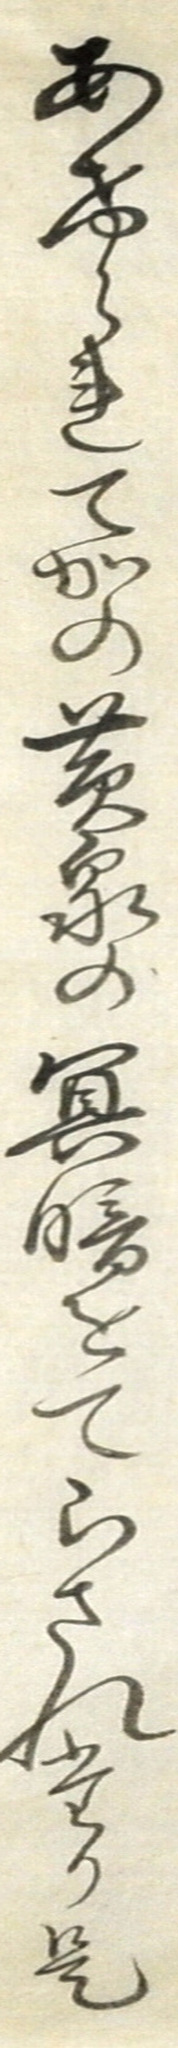あけられてかの黄泉の冥暗をてらされたり是
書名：藩翰譜（六）
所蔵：伊那市立高遠町図書館・合同会社AMANE
